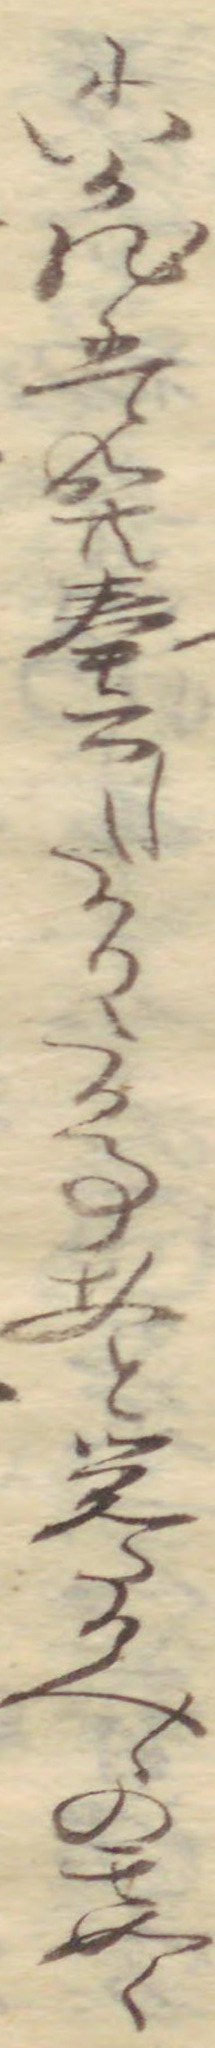にいか程にて成共奉公したかりたる事なと覚たる人〳〵の其如く
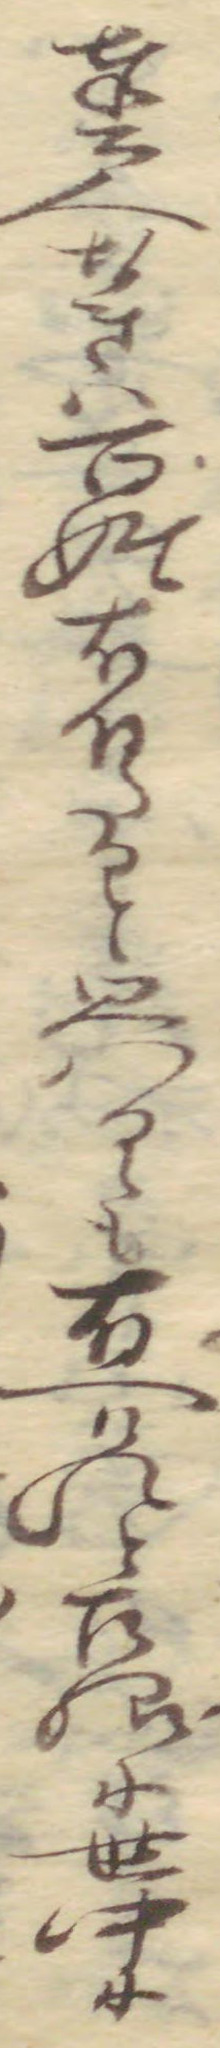奉公人なきは百姓有付たると思はるゝも有へけれと左様に世中に
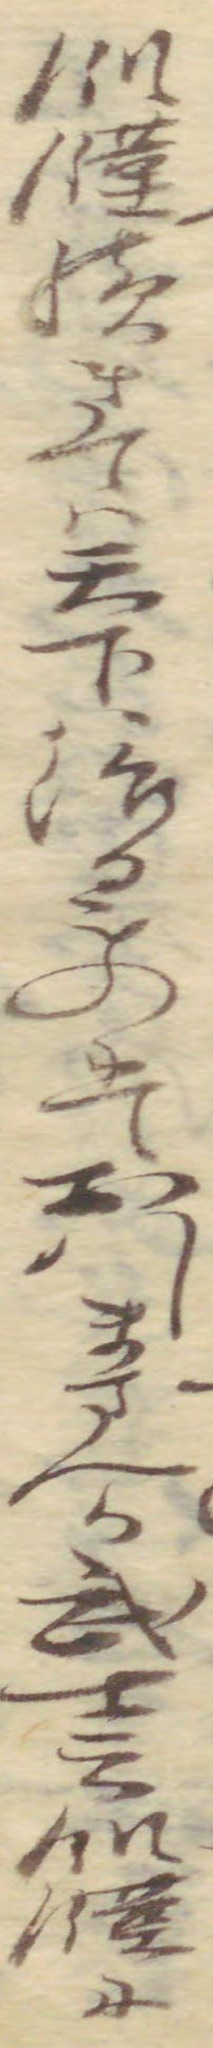飢饉続きては天下は治るものにておはしまさんか武士云飢饉に
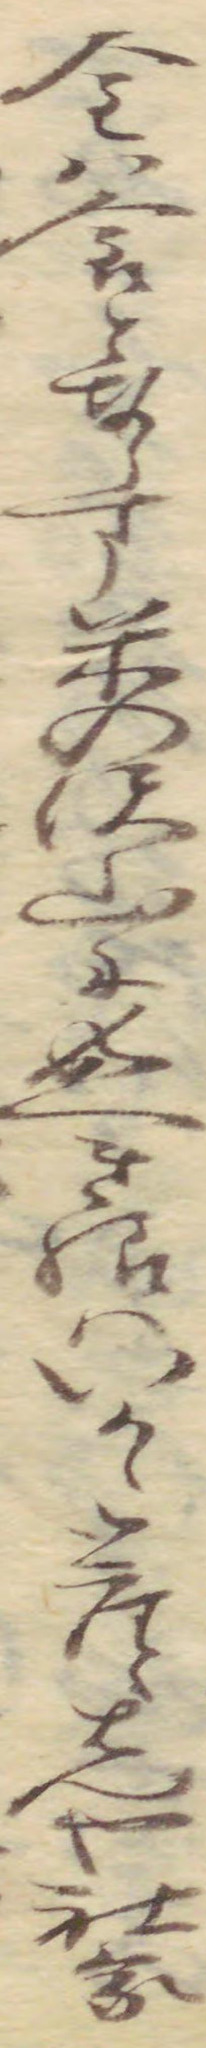金は食とならす米の沢山に成へき様はいかゝ御座候はんや社家
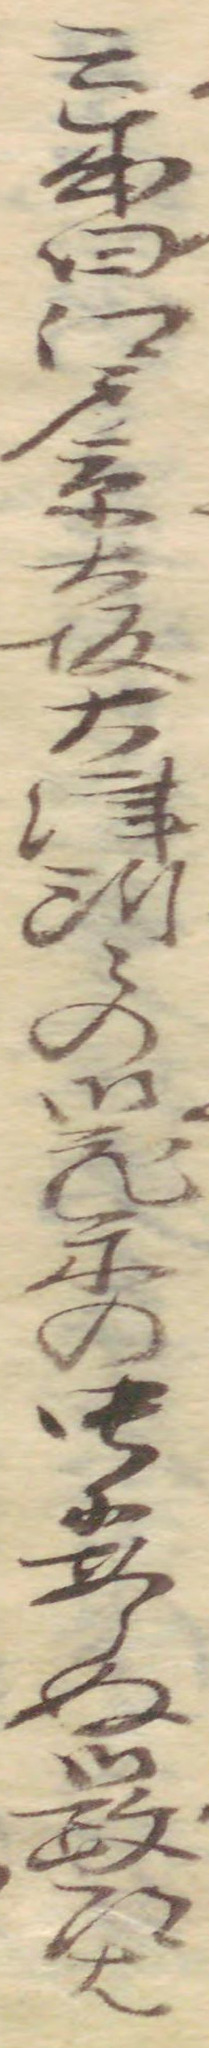云或曰江戸京大坂大津所〻の御蔵米の虫にならぬ御政道は
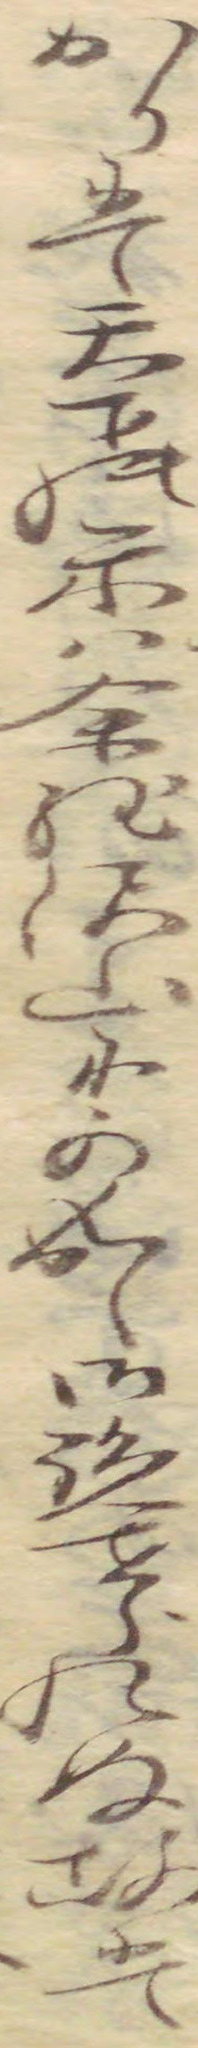かりにて天下の米は余程沢山に可成候御覧せられぬ故にて
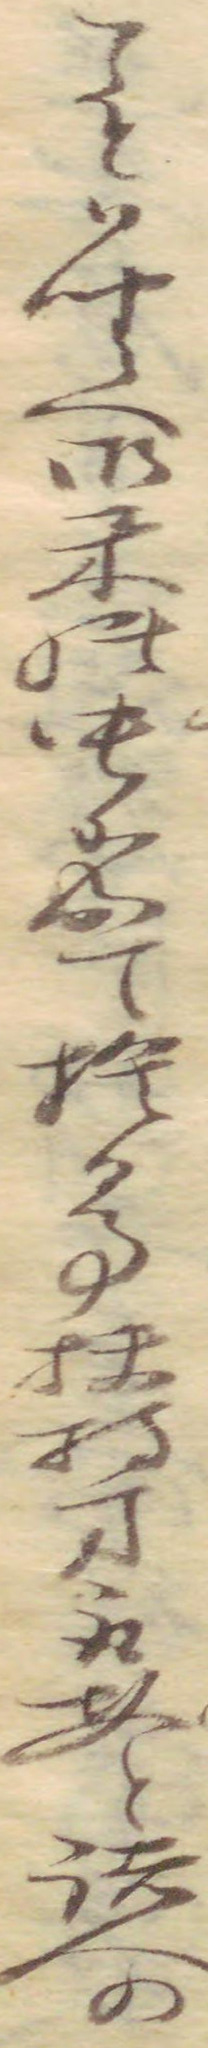こそ御座候へ御米之虫に成て捨る事扶持方取なと諸人の

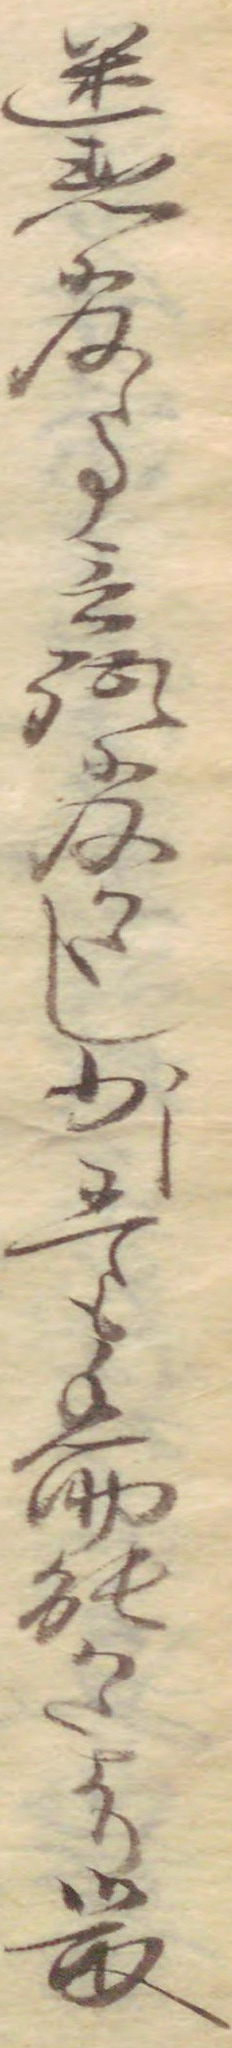迷惑に及候事言語に及かたし少しにても手筋能かたより御取
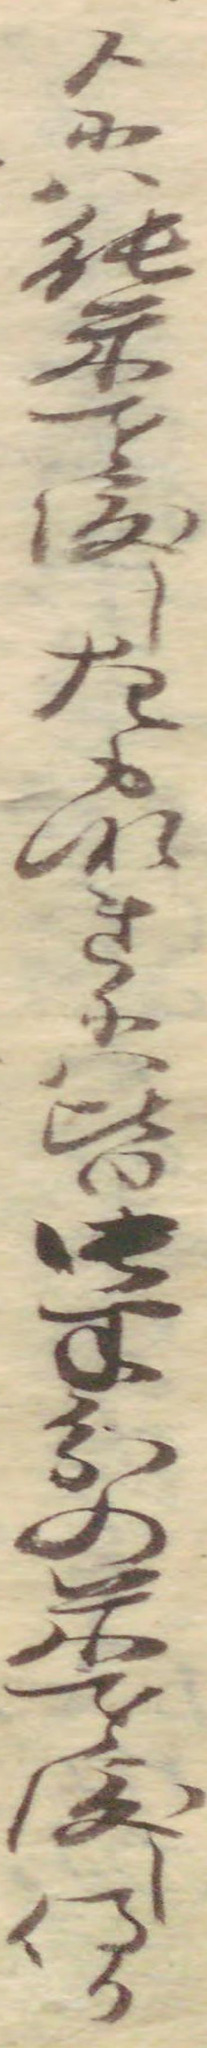候には能米を渡しさもなきには皆虫半分の米を渡し侍り
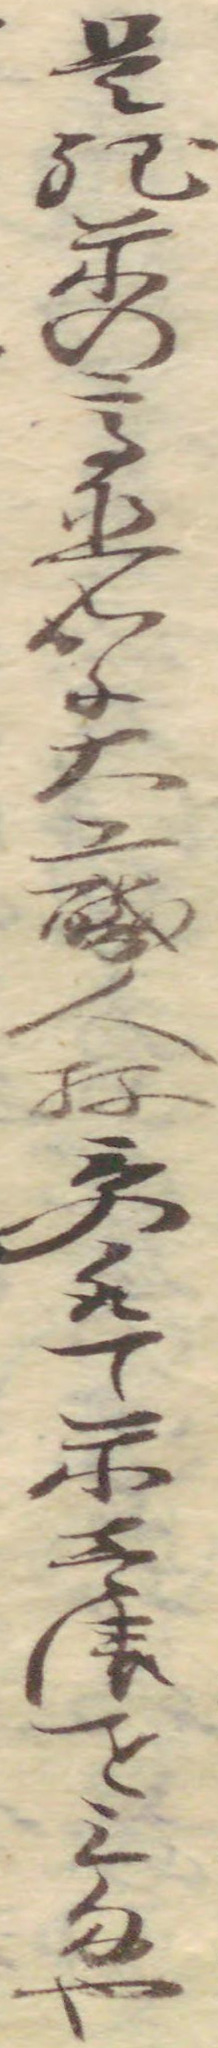是程米の高直成に大工職人抔受取て米壱俵を三匁や
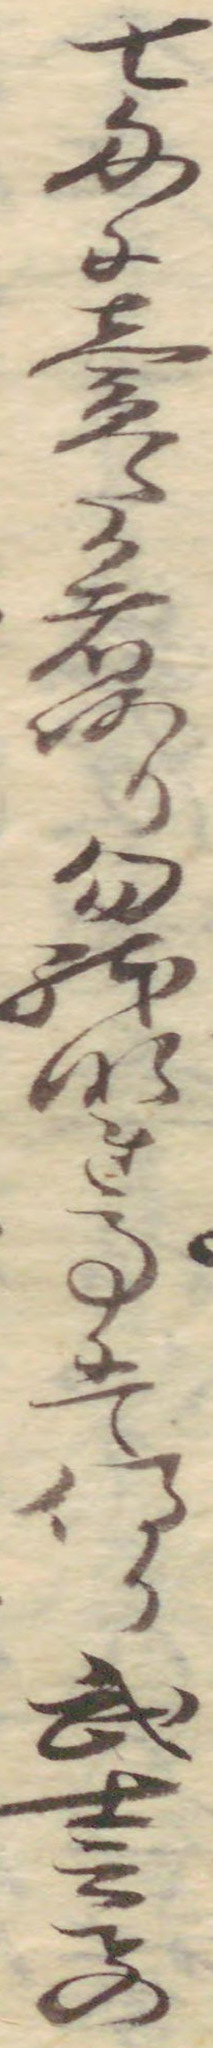七匁に売たる者あり勿体なき事にて侍り武士云その
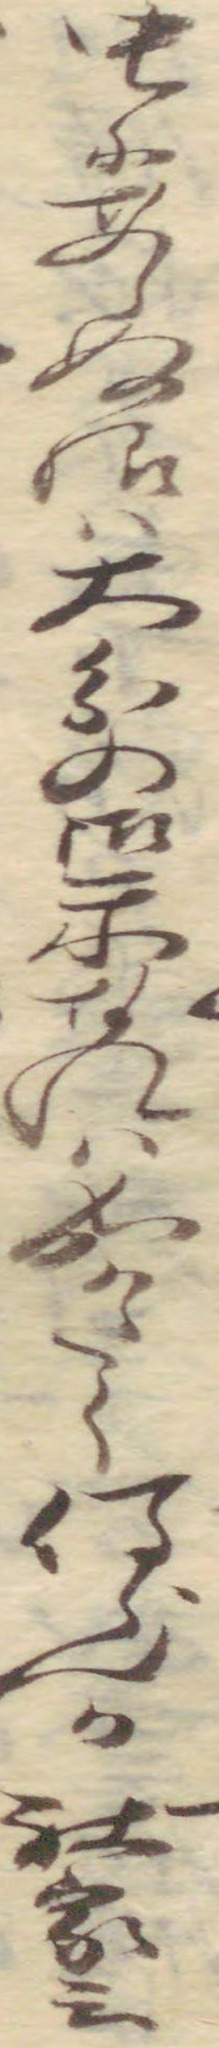虫にならぬ様は大分の御米なれは成かたく侍らんか社家云
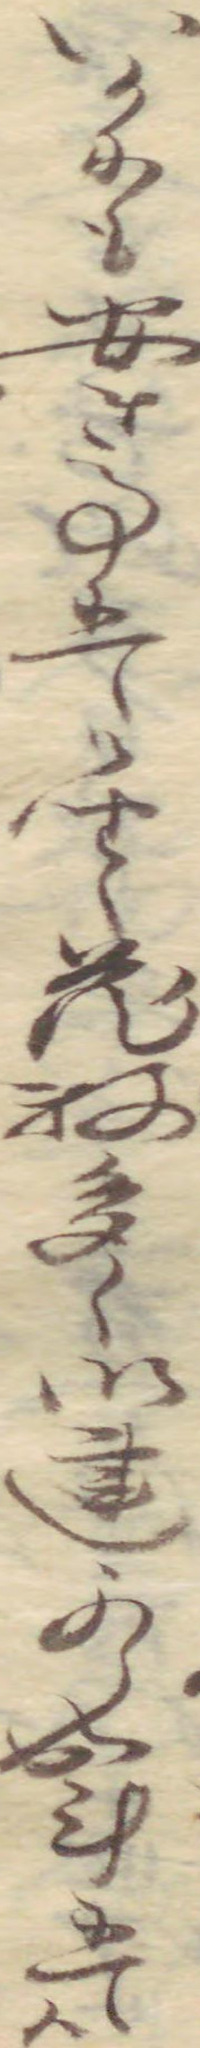いかにも安き事にて御座候蔵数多く御建可被成計にて候
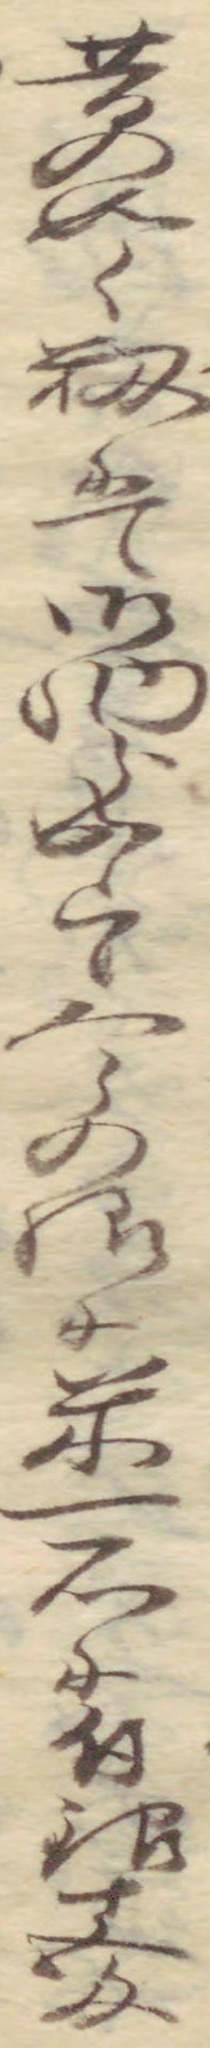昔の如く籾にて御納被成候はゝ今の様に米一石に付銀十五匁
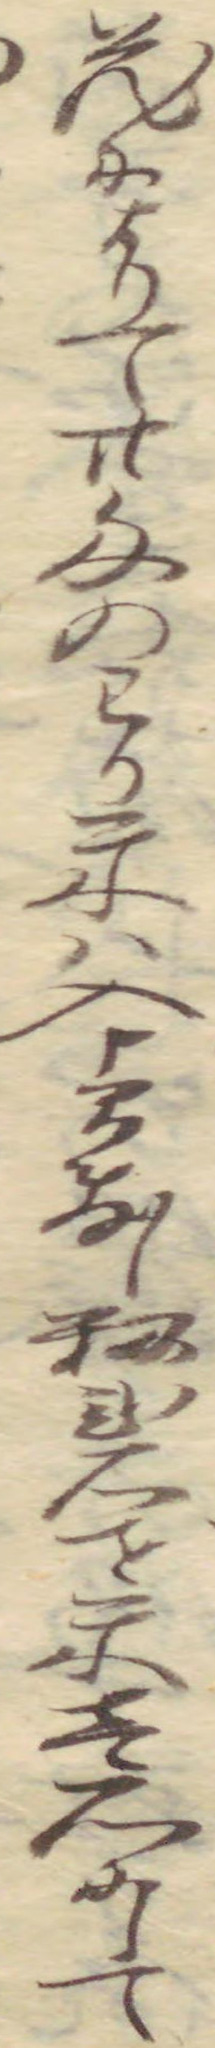蔵によりて廿匁のわり米は入申間敷候籾弐石を米壱石にして
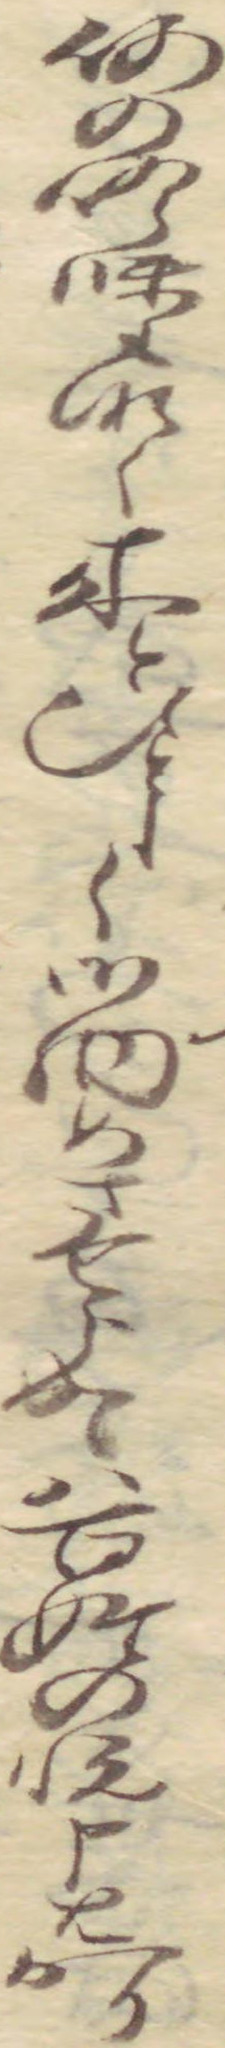何の吟味もなく来とひとしく御納めさせ被成候は百姓の悦申はかり
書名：鶯宿雑記. 巻263-264
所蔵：国立国会図書館 National Diet Library, JAPAN
